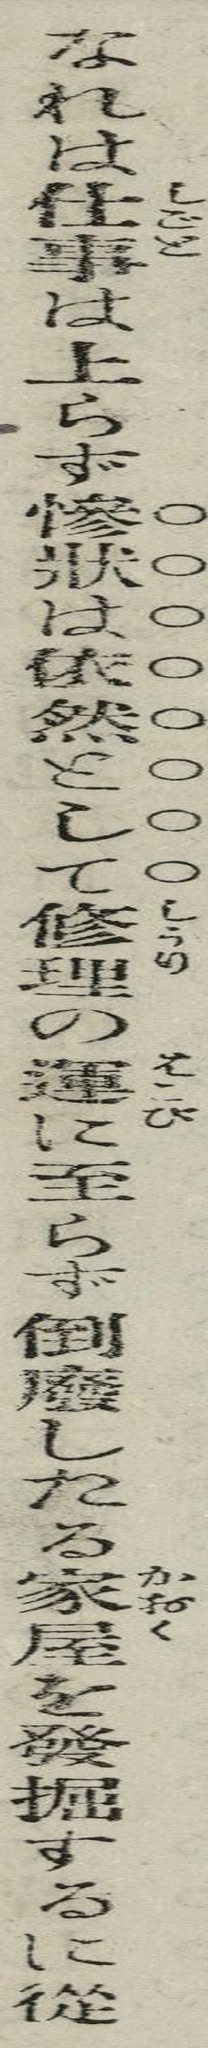なれは仕事は上らず惨状は依然として修理の運に至らず倒廃したる家屋を発掘するに従
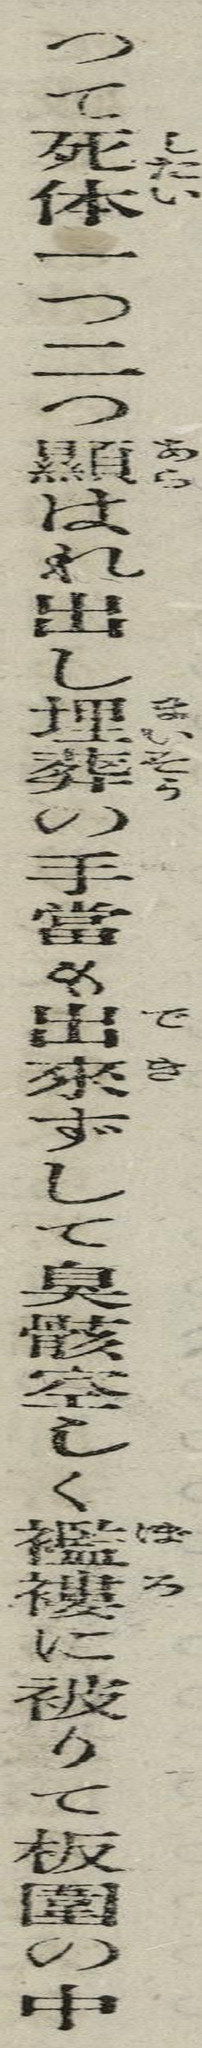つて死体一つ二つ顕はれ出し埋葬の手当も出来ずして臭骸空しく襤褸に被りて板囲の中
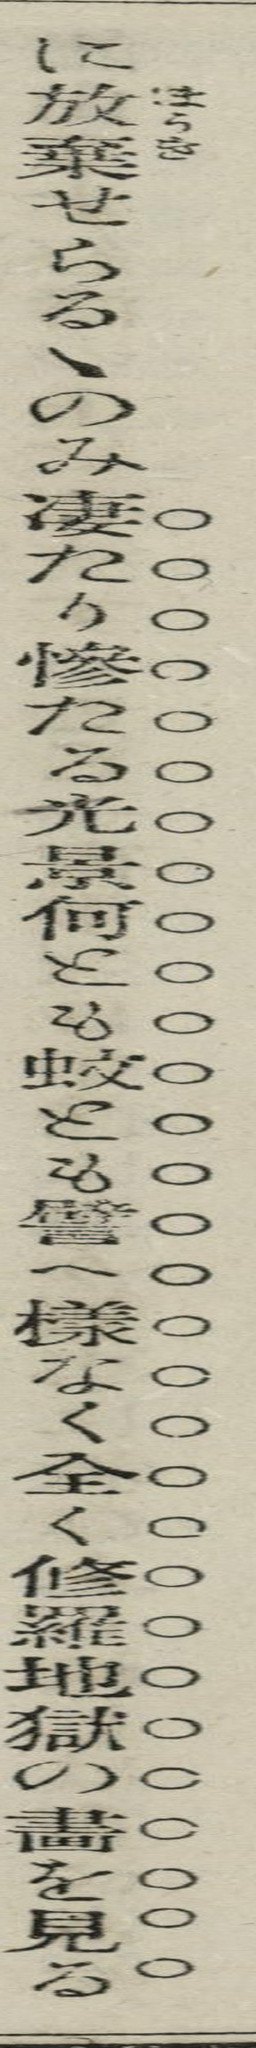に放棄せらるのみ凄たり惨たる光景何とも蚊とも譬へ様なく全く主ら地獄の書を見る
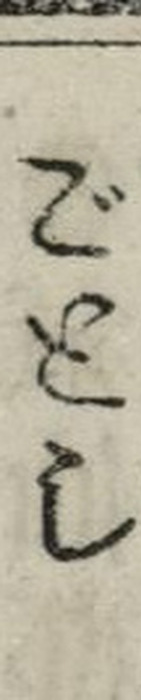ごとし
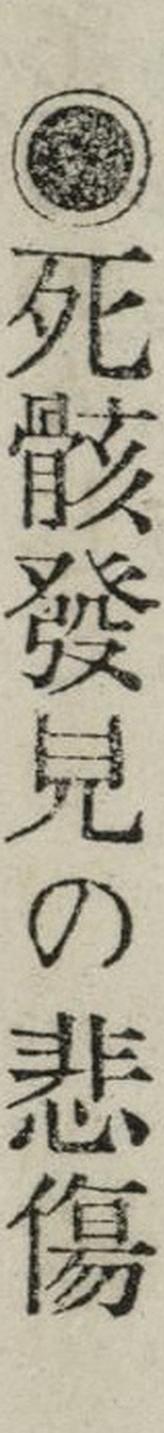●死骸発見の悲傷
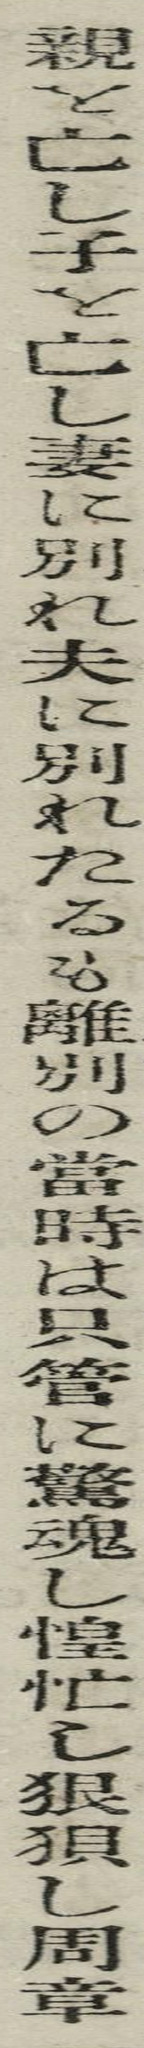親を亡し子を亡し妻に別れ夫に別れたるも離別の当時は只管に驚魂し徨忙し狼狽し周章
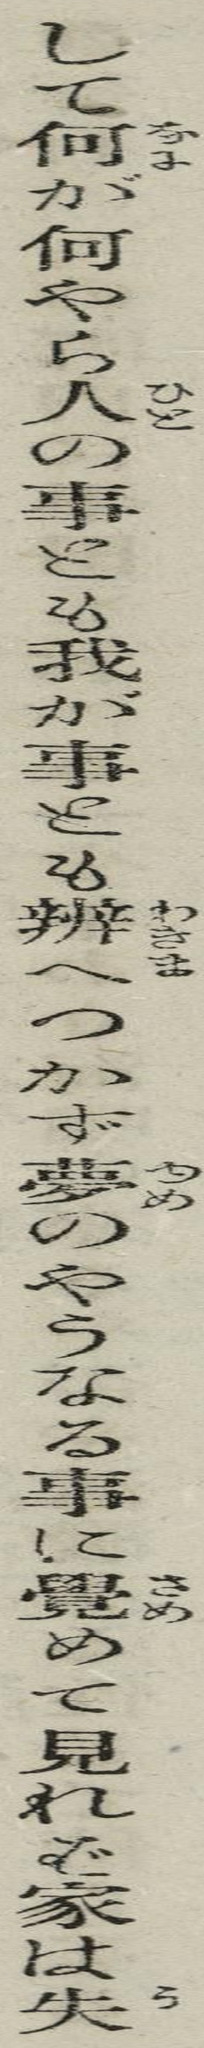して何が何やら人の事とも我が事とも弁へつかず夢のやうなる事に覚めて見れば家は失
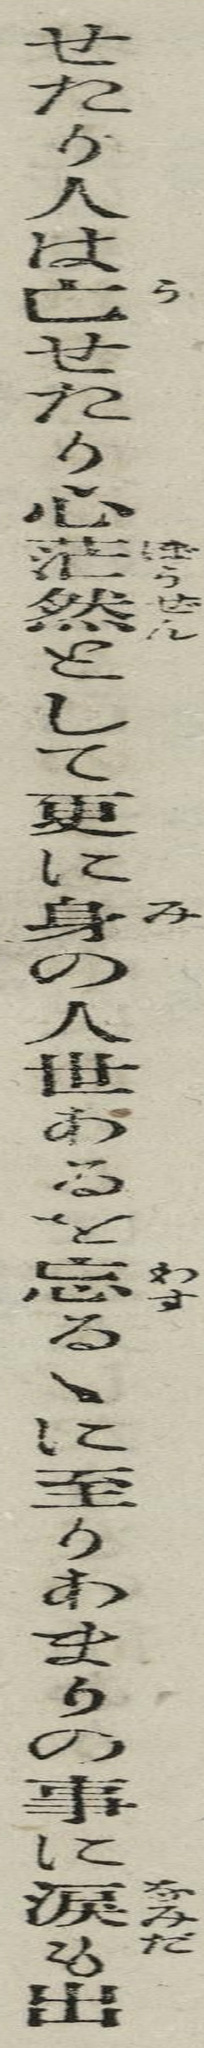せたり人は亡せたり心茫然として更に身の人世あるを忘るに至りあまりの事に涙も出
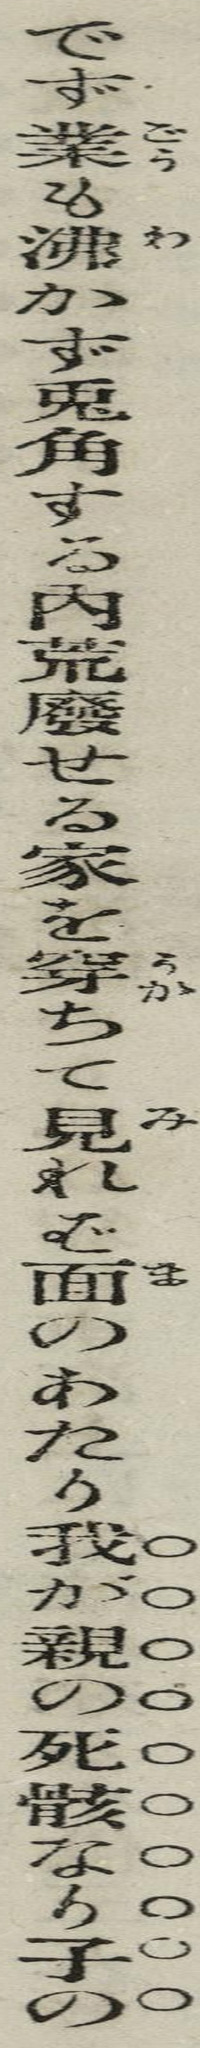でず業も沸かず兎角する内荒廃せる家を穿ちて見れば面のあたり我が親の死骸なり子の
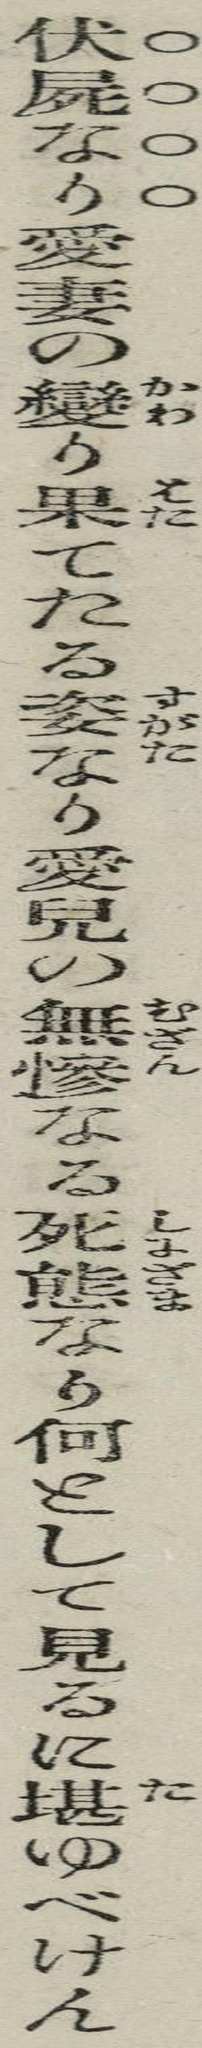伏屍なり愛妻の変り果てたる姿なり愛児の無残なる死態なり何として見るに堪ゆべけん
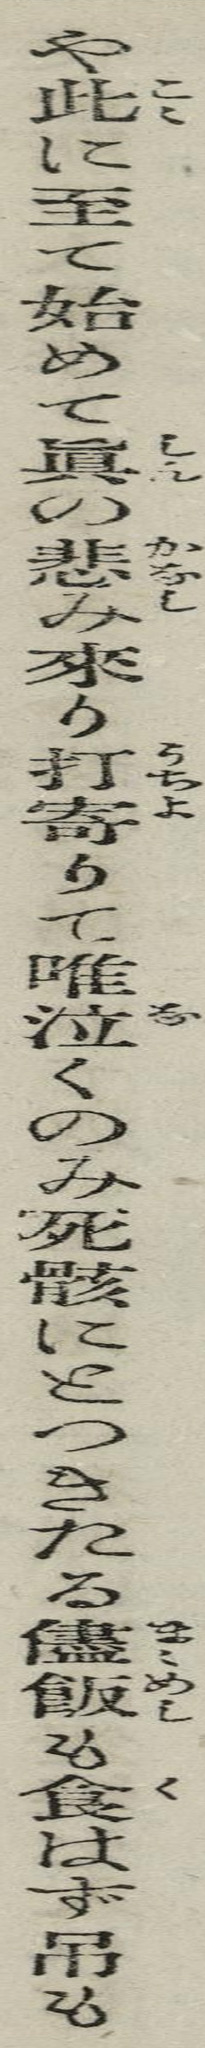や此に至て始めて眞の悲み来り打寄りて唯泣くのみ死骸にとつきたる儘飯も食はず吊も
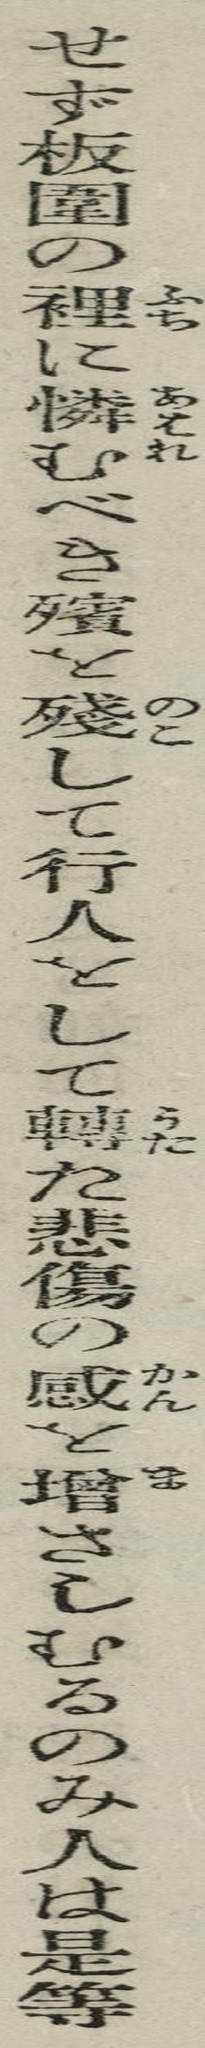せず板囲の裡に憐むべき殯を残して行人をして轉た悲傷の感を増さしむるのみ人は是等
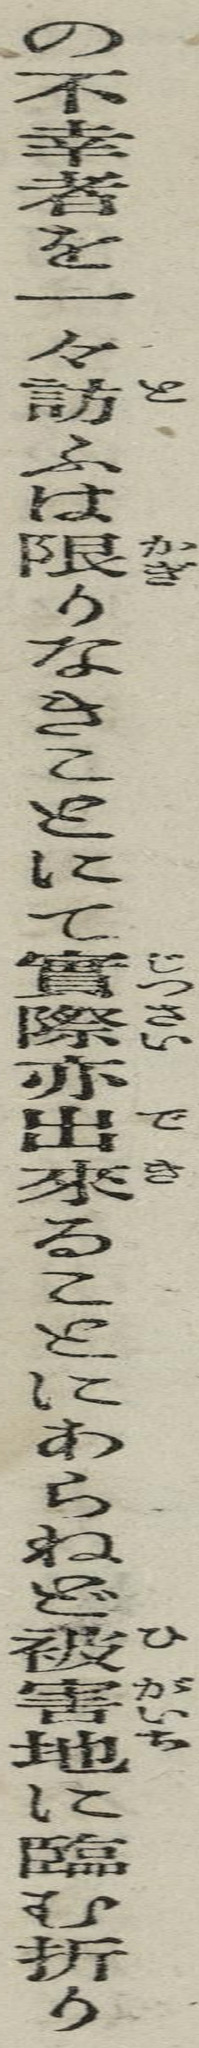の不幸者を一々訪ふは限りなきことにて実際亦出来ることにあらねど被害地に臨む祈り
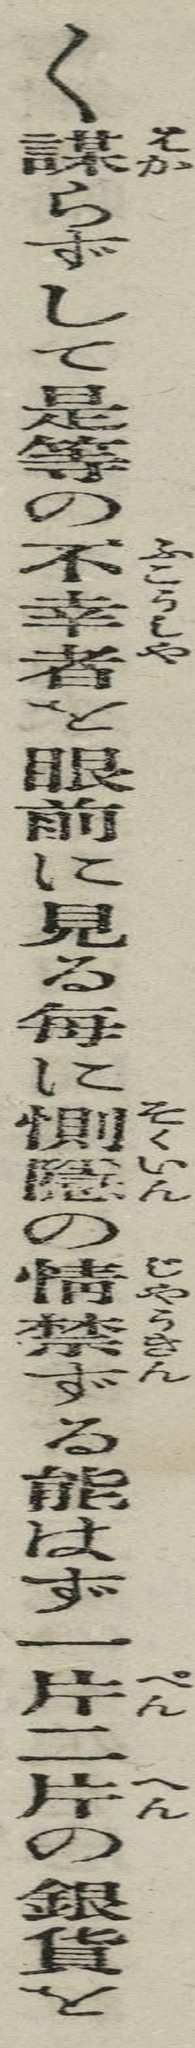〳〵謀らずして是等の不幸者と眼前にみる毎に惻隠の情禁ずる能はず一片二片の銀貨と
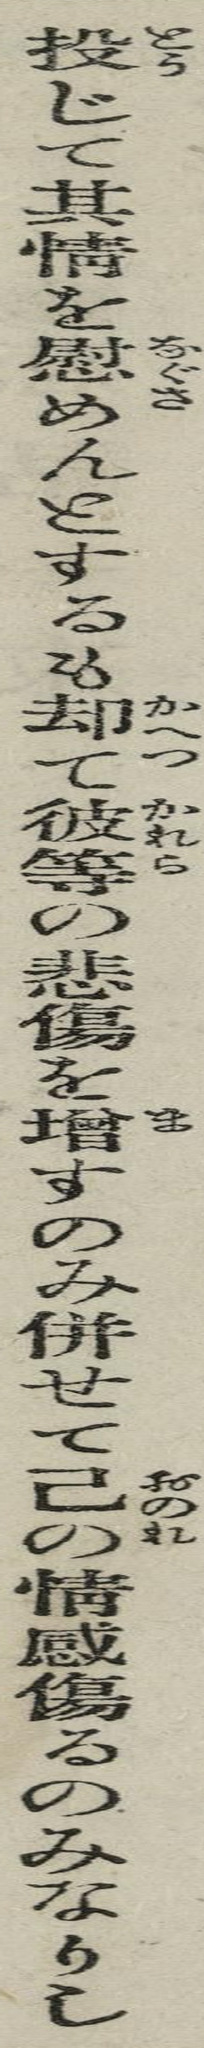投じて其情を慰めんとするも却て彼等の悲傷を増すのみ併せて己の情感傷るのみなりし

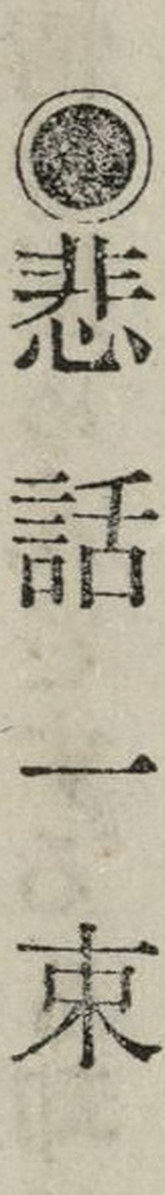●悲話一束
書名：三陸海嘯細見
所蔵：東京大学地震研究所図書室 Earthquake Research Institute Library, The University of Tokyo, JAPAN
